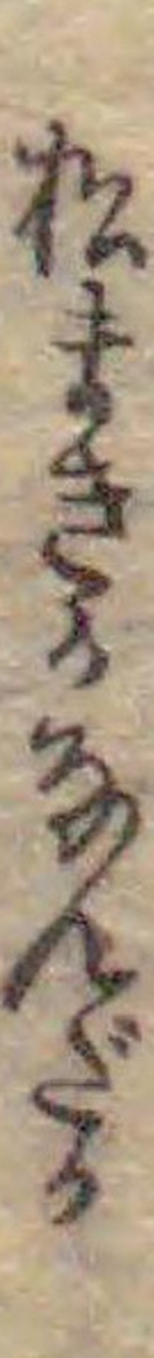松まきかなんだか
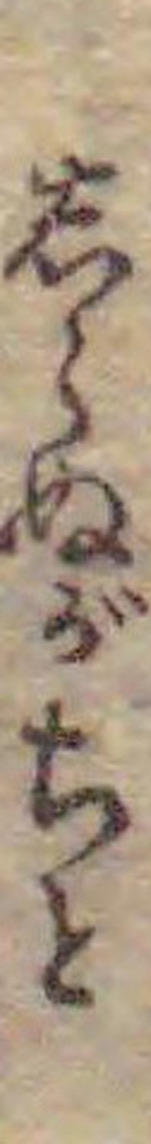しらぬがちと
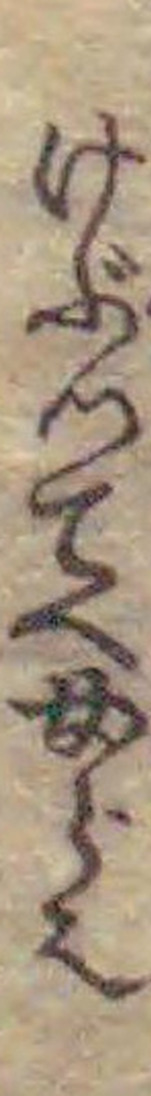けぶつてへ女郎也
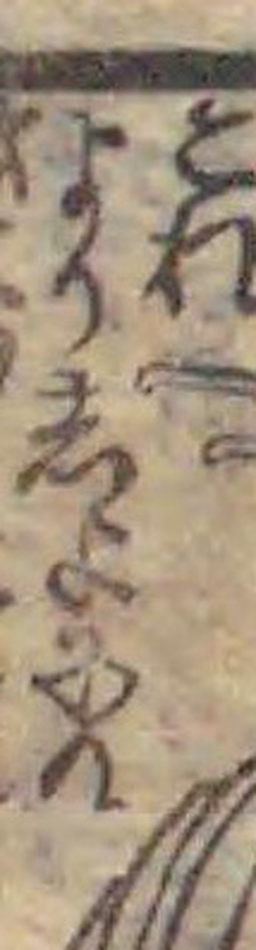よりしよにん
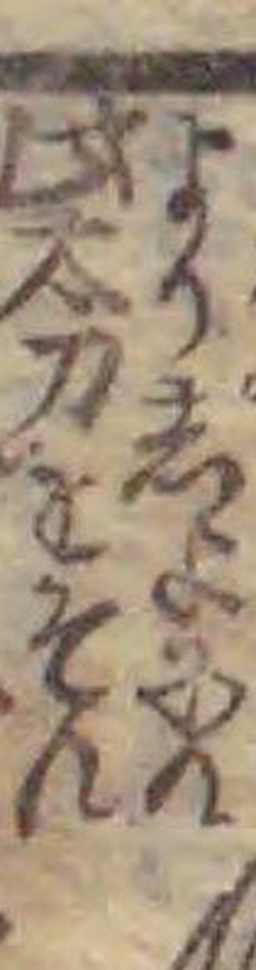此太刀をそん
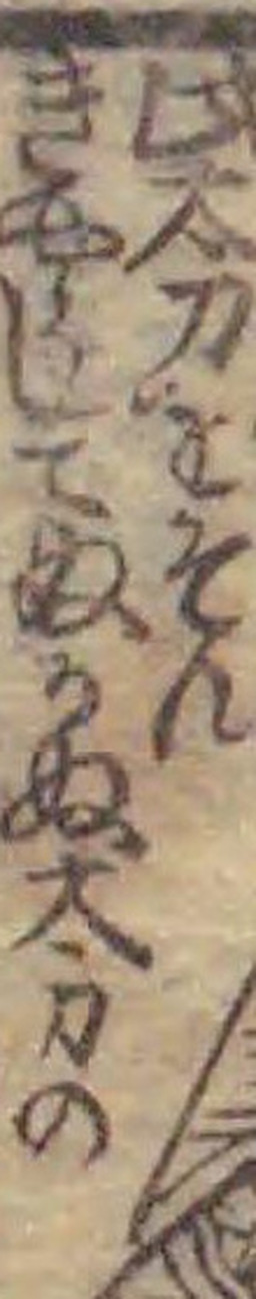きやうしてぬかぬ太刀の

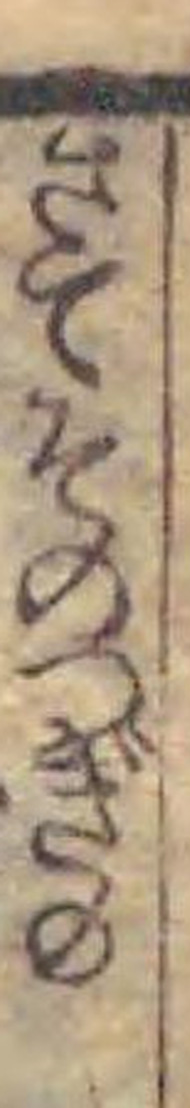さてそのつぎの
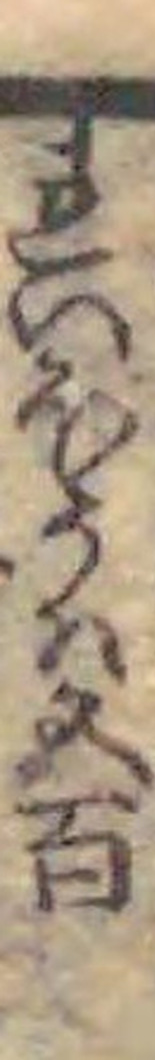れいほうは五百
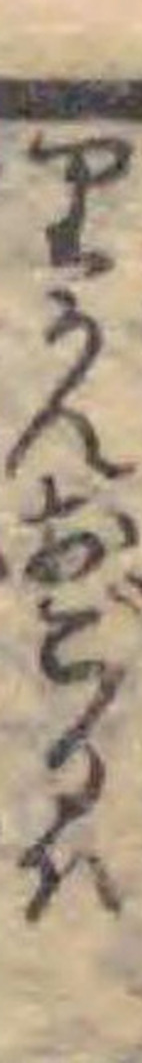りかんおごるは
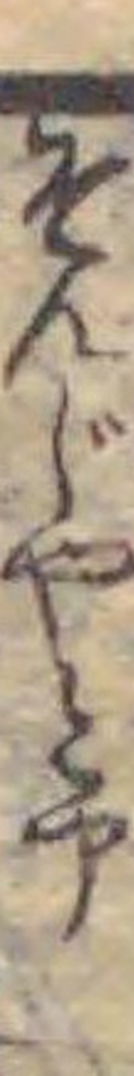そんじやと申
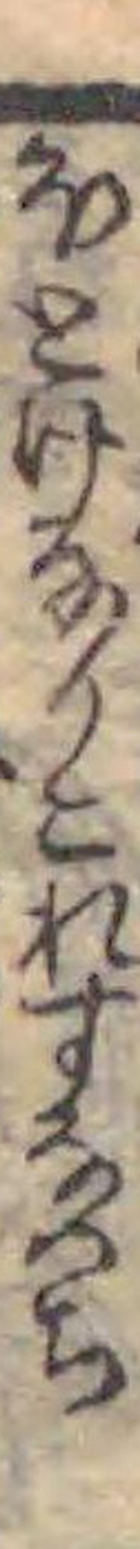ほとけなりこれすなはち
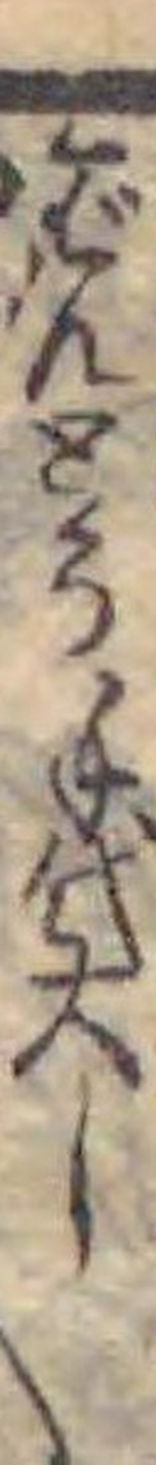ばんとう手代大し
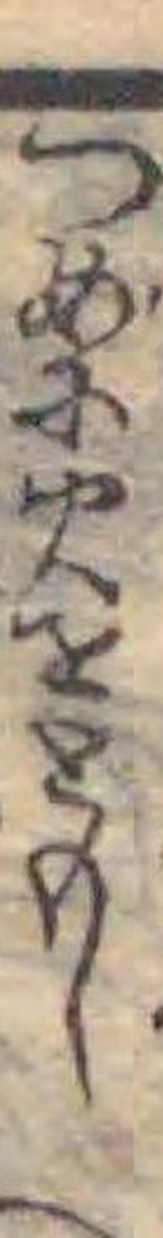つめに火をともし
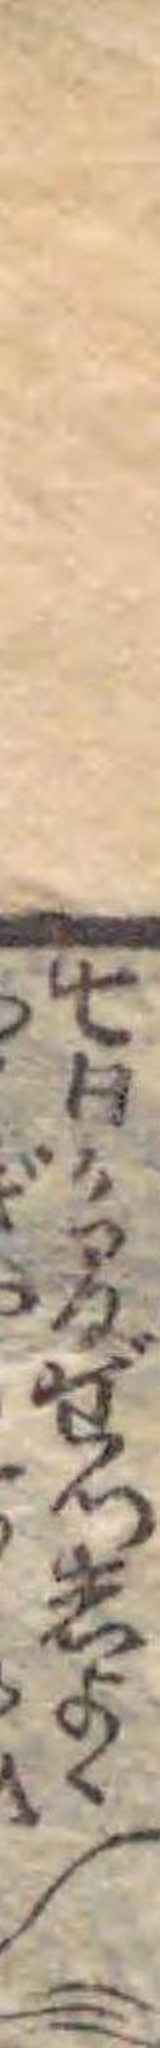七日か間ぜつしよく
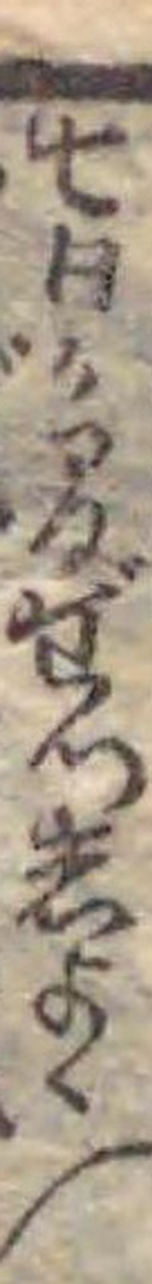七日か間ぜつしよく
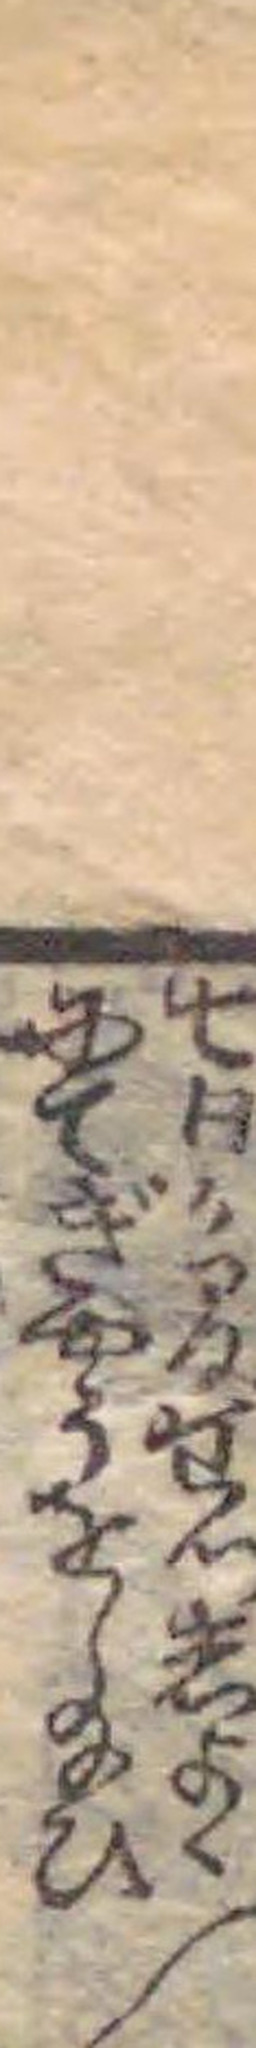にてぎやうをし給ひ
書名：身体開帳略縁起 : 3巻
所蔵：国立国会図書館 National Diet Library, JAPAN
